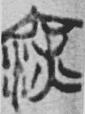深
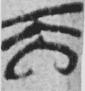而
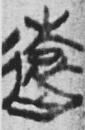遠
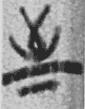至
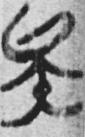矣
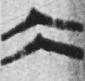大
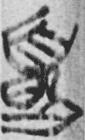○（雅）
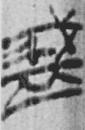盛
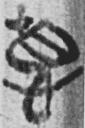惪（德）
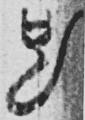也
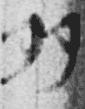多
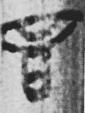言
